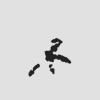不
